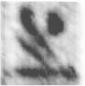之
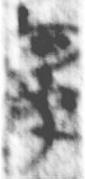○（緅）
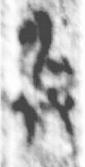紳（靷）
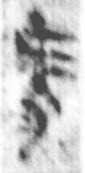○（虎）
